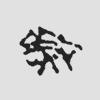敬
